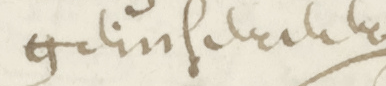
geinsereert.
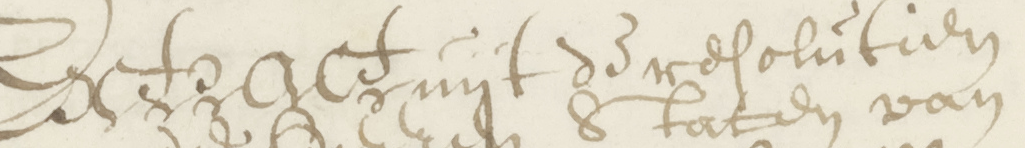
Extract uijt de resolutien
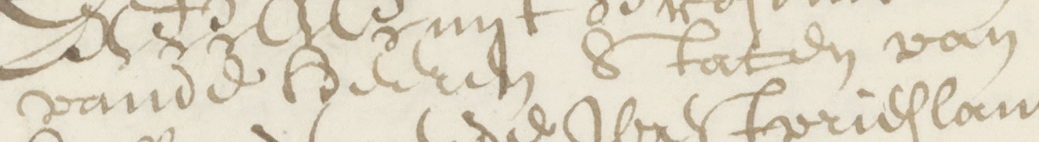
vande Heeren Staten van
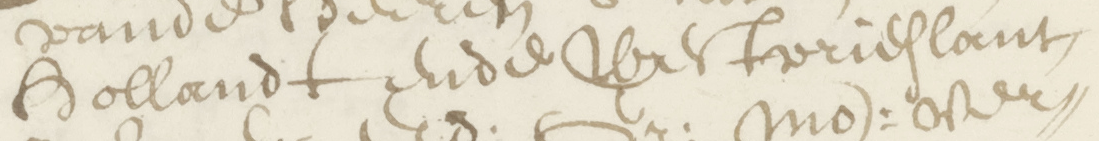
Hollandt ende Westvrieslant,
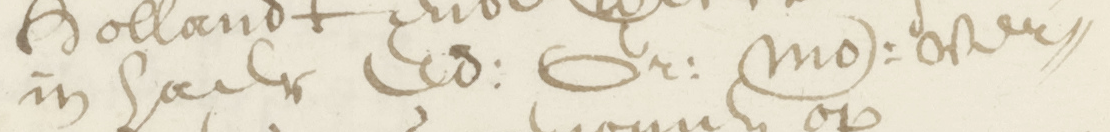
in haer Ed:Gr:Mo: Ver,,
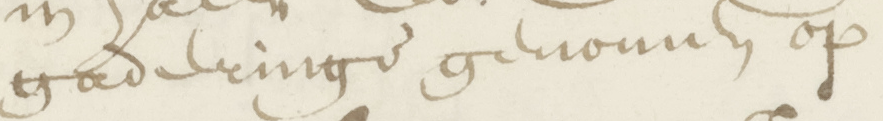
gaderinge genomen op
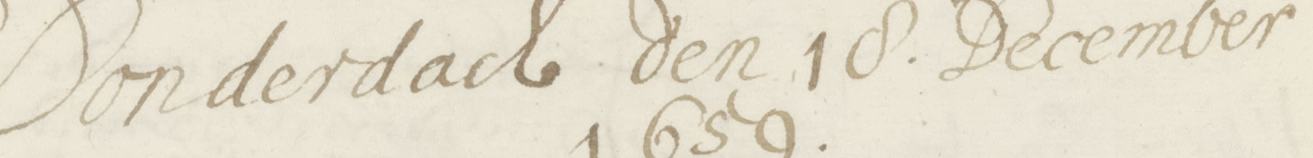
Donderdach den 18. December
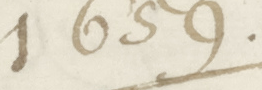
1659
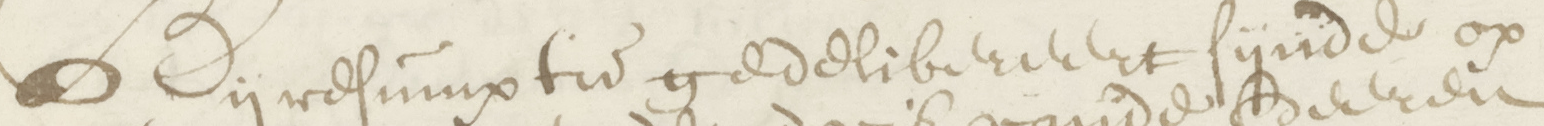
Bij resumptie gedelibereert sijnde op
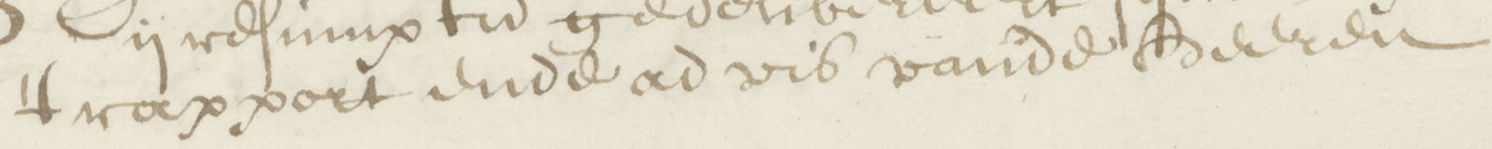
't rapport ende advis vande Heeren
